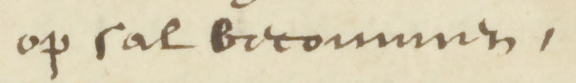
op sal becommen.
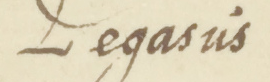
Pegasus
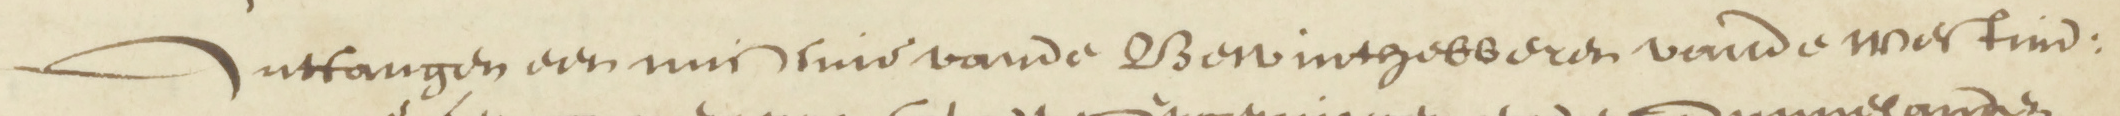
Ontfangen een missiue vande Bewinthebberen vande Westind:
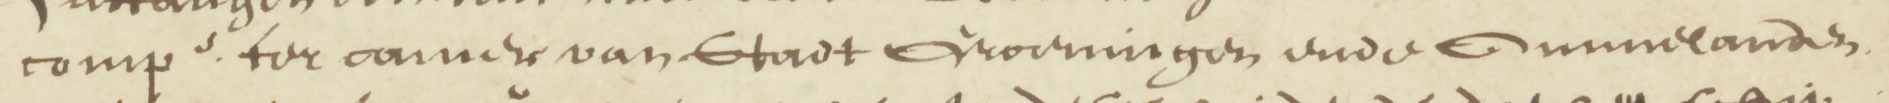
compe ter camer van Stadt Groeningen ende Ommelanden
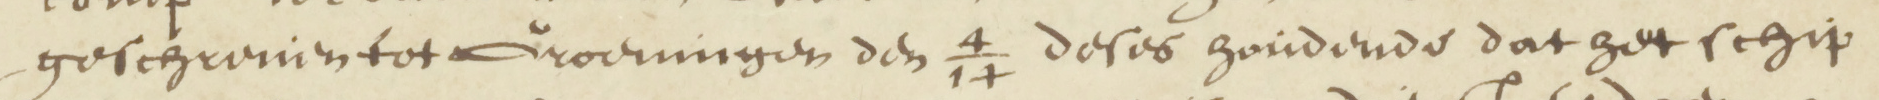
geschreuen tot Groeningen den 4/14 deses houdende dat het schip
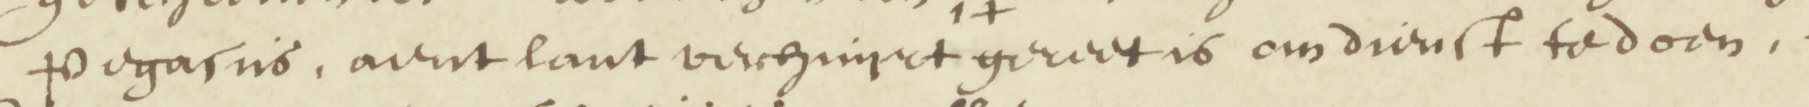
Pegasus, aent lant verhuyrt gereet is om dienst te doen.
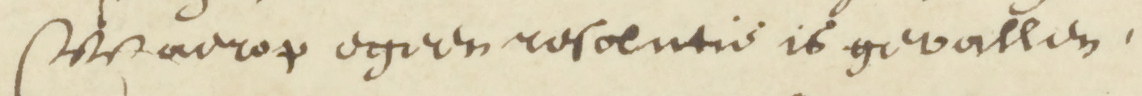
Waerop egeen resolutie is gevallen.
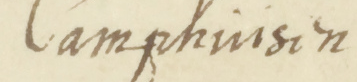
Camphuisen
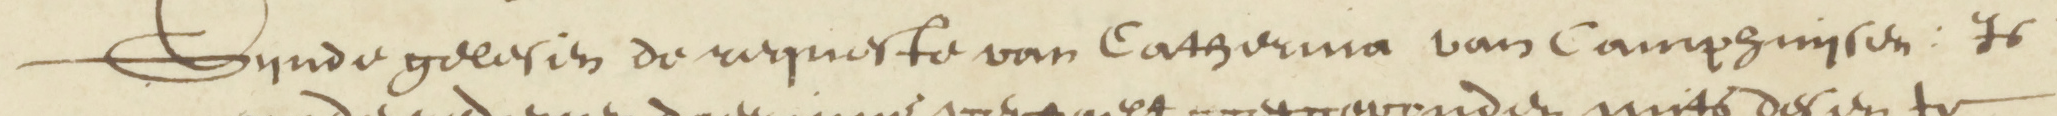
Synde gelesen de requeste van Catherina van Camphuysen: Is
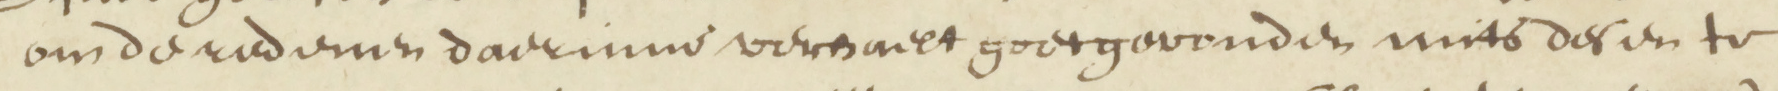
om de redenen daerinne verhaelt goetgevonden mits desen te
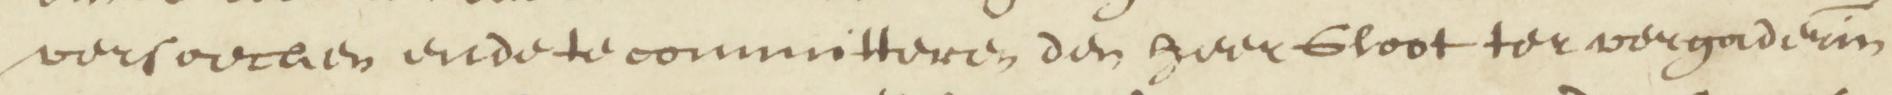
versoecken ende te committeren den heer Sloot ter vergaderin
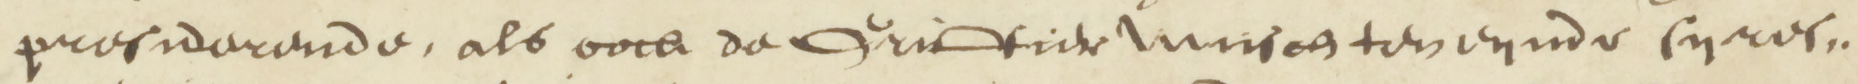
presiderende, als oock de Griffier Musch ten eynde sy res„
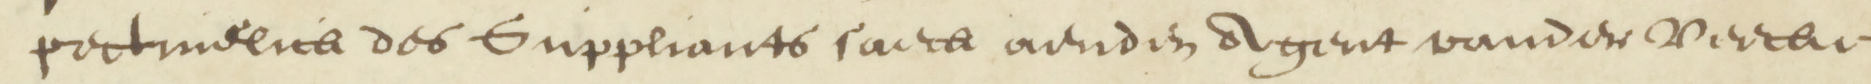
pectiuelick des Suppliants saeck aen den Agent vander Veecke
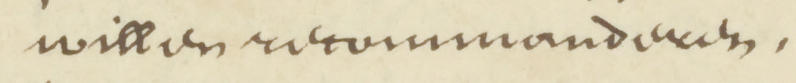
willen recommanderen.
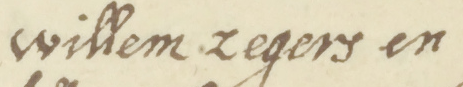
willem zegers en
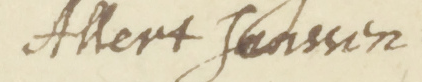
Allert Janssen.
